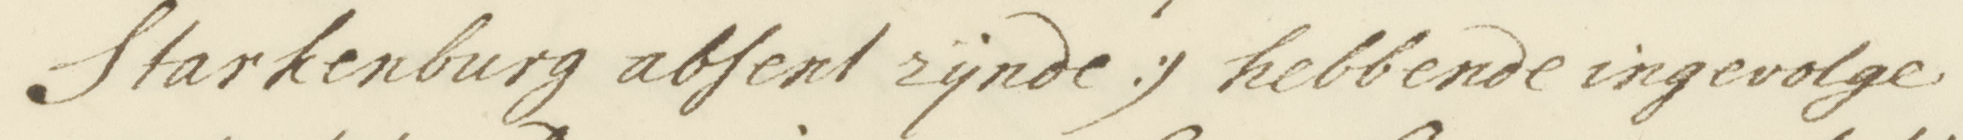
Starkenburg absent zijnde :), hebbende ingevolge
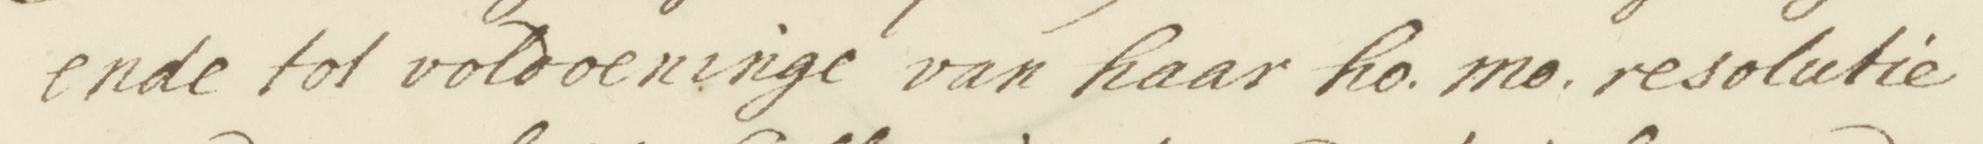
ende tot voldoeninge van haar ho:mo: resolutie
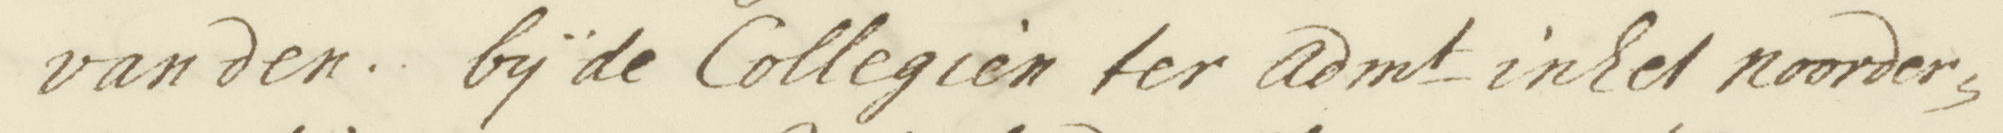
vanden .. bij de Collegien ter Admt inhet noorder,,
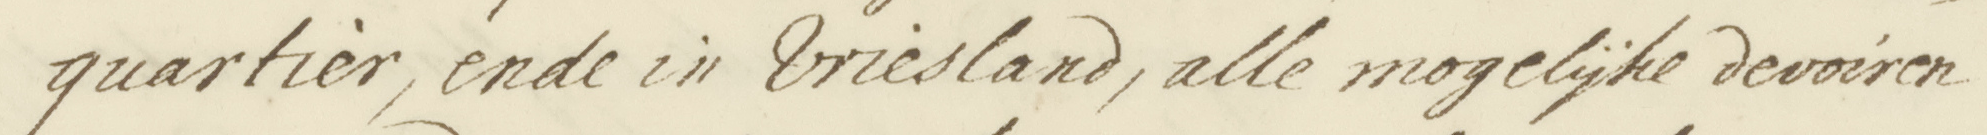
quartier, ende in Vriesland, alle mogelijke devoiren
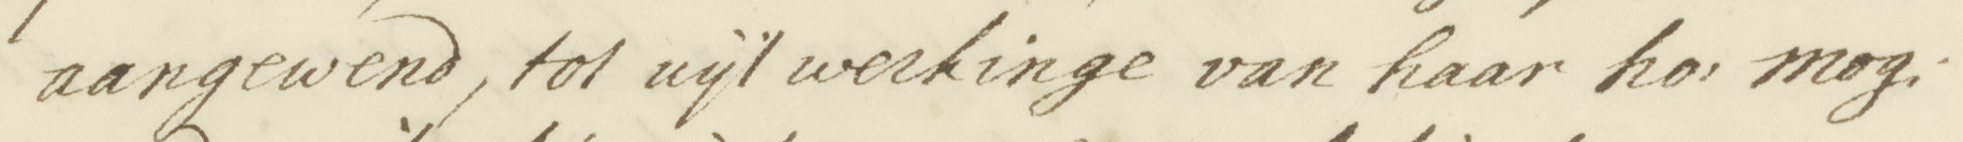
aangewend, tot uijt werkinge van haar ho: mog:
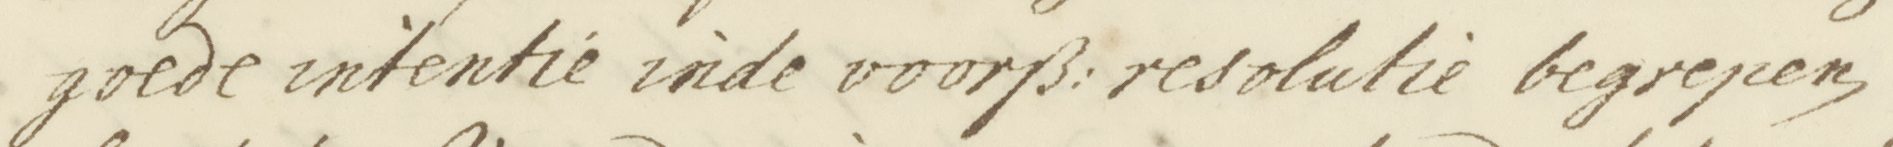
goede intentie inde voors: resolutie begrepen
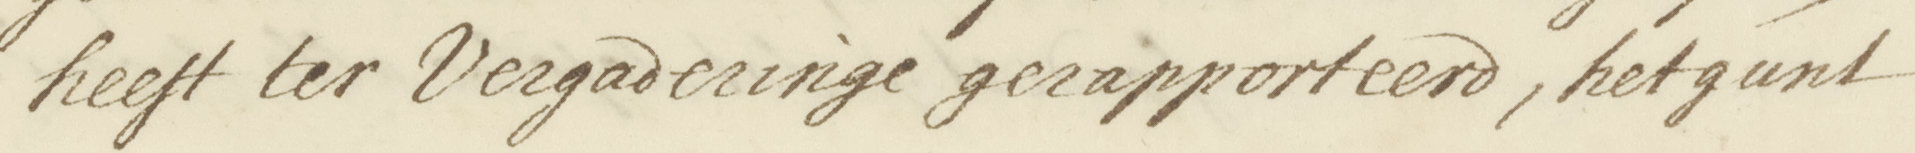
heeft ter vergaderinge gerapporteerd, het gunt
